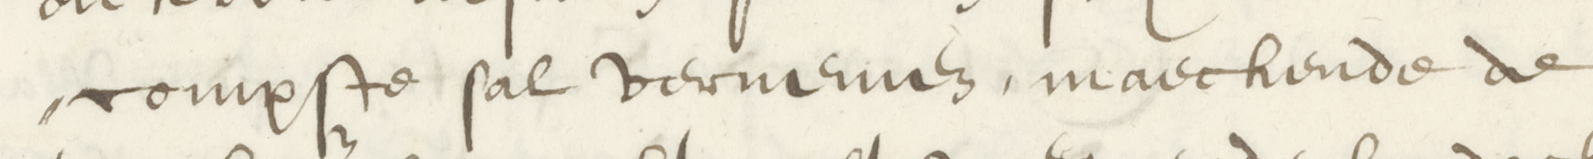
,,compste sal vernemen, maeckende de
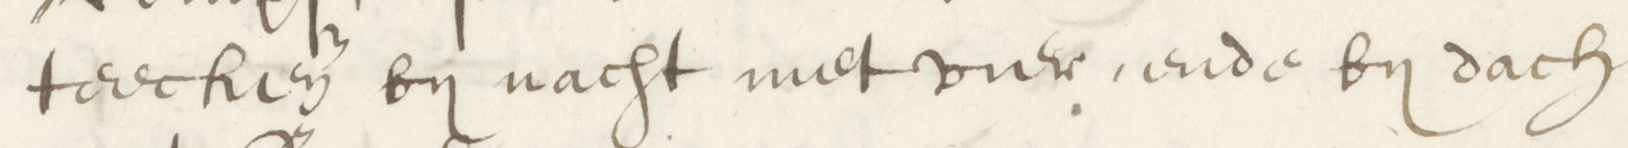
teecken bij nacht met vuer, ende bij dach
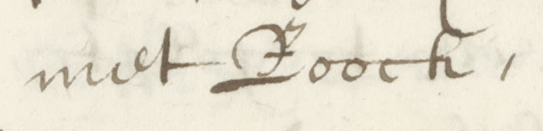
met Roock.
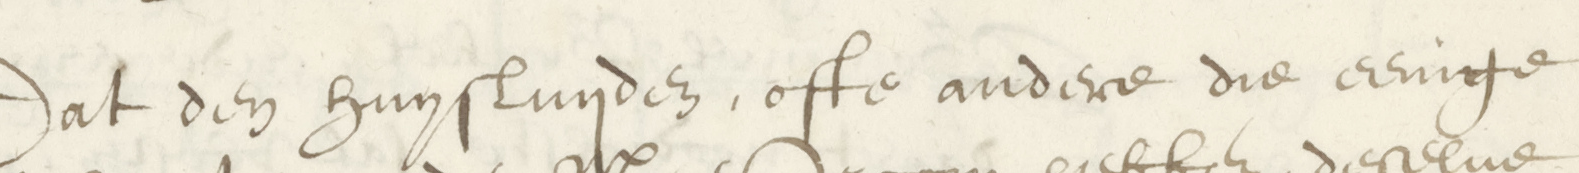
Dat den huysluyden, ofte andere die eenige
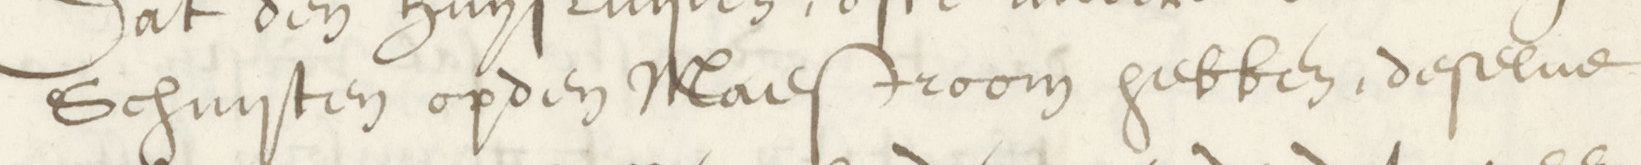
Schuyten opden Maestroom hebben, deselue
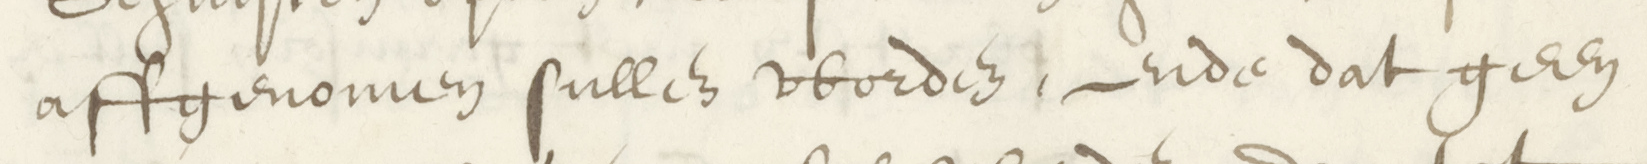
affgenomen sullen worden, ende dat geen
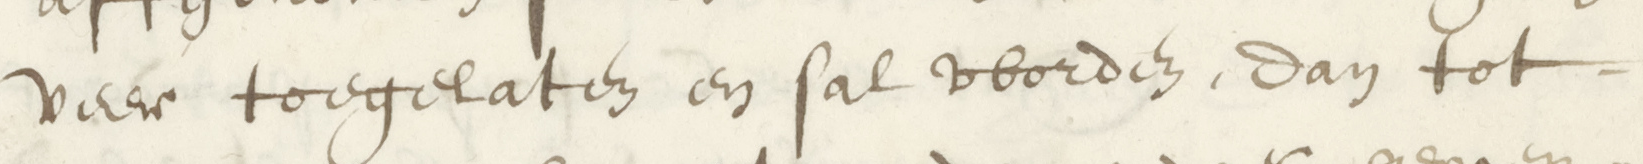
veer toegelaten en sal worden, dan tot
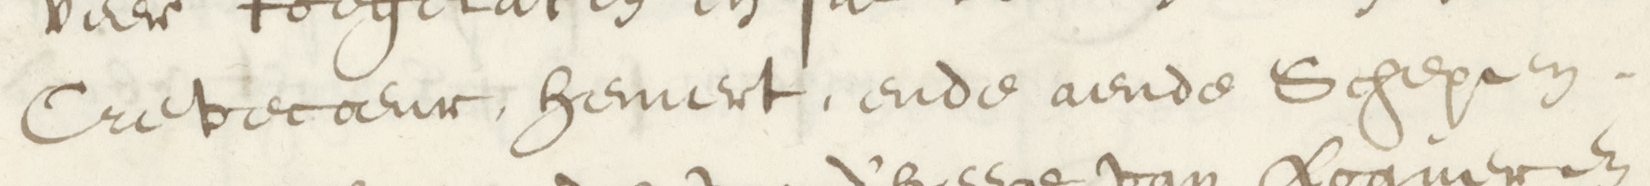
Crevecoeur, Hemert ende aende Schepen
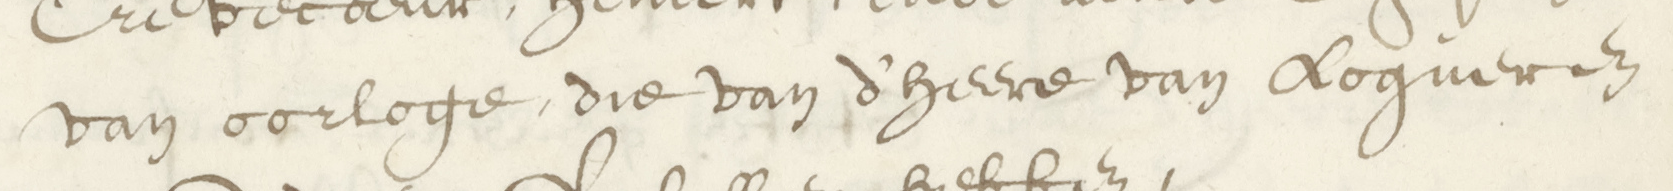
van oologe, die van d'heere van Loqueren
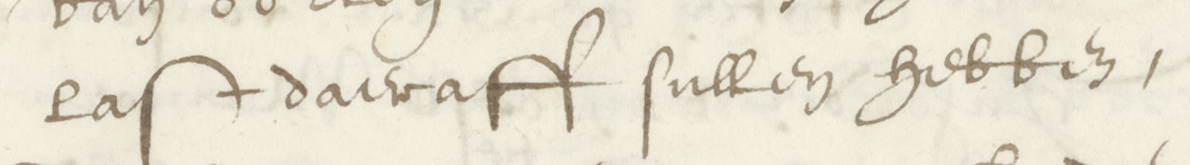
last daeraff sullen hebben.
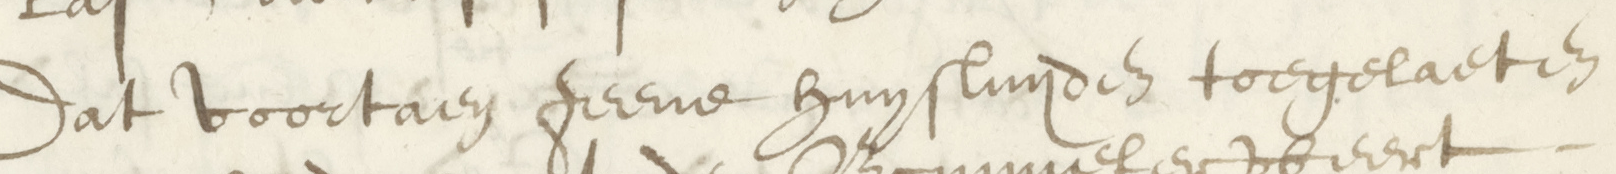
Dat voortaen geene huysluyden toegelaeten
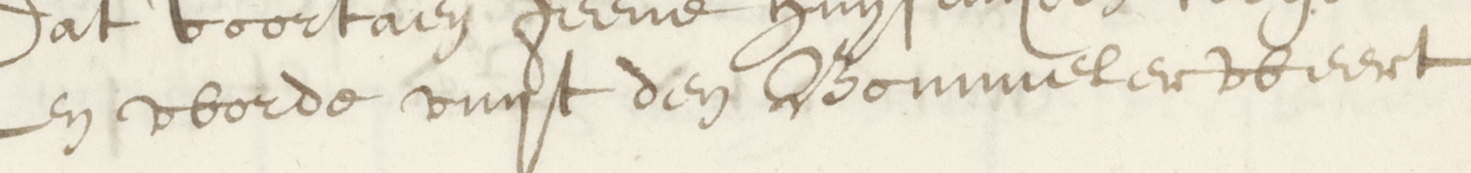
en worde vuyt den Bommelerweert
